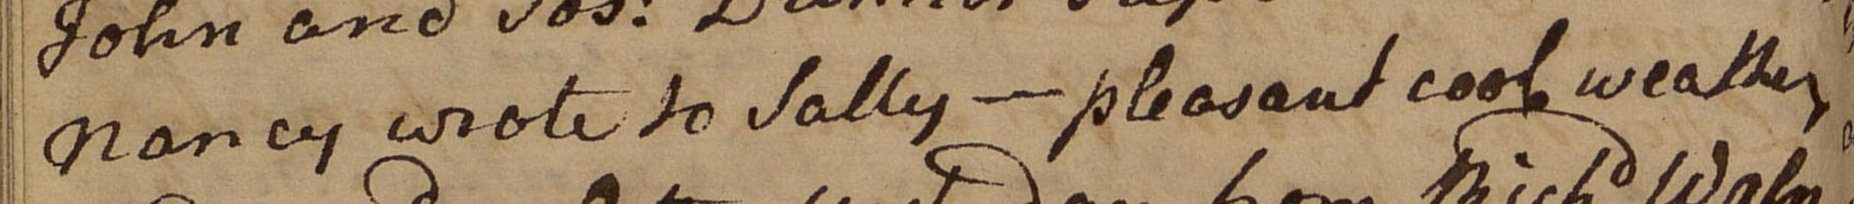Nancy wrote to Sally- pleasant cool weather
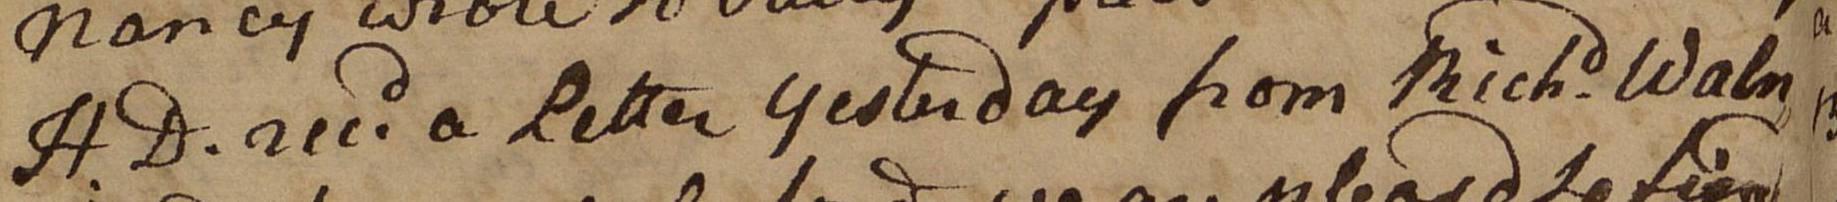H D rec.^d a Letter Yesterday from Rich^d. Waln
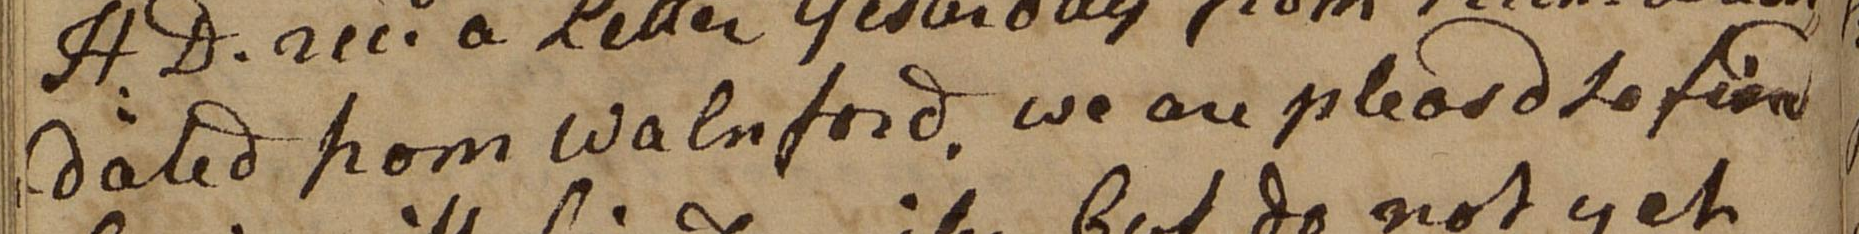dated from Walnford, we are pleasd to find
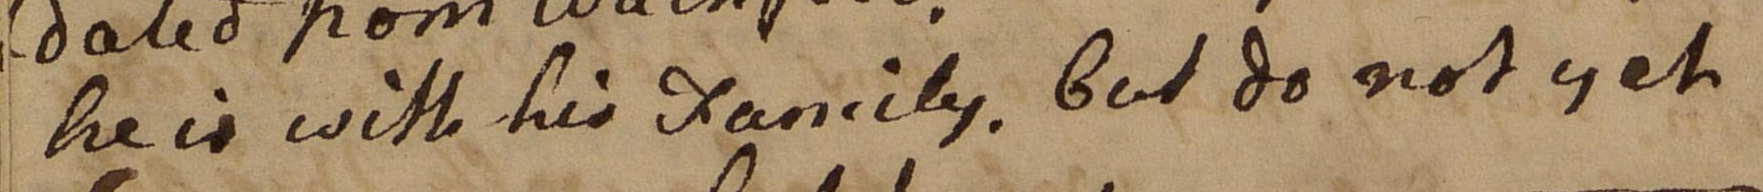he is will his Family, but do not yet
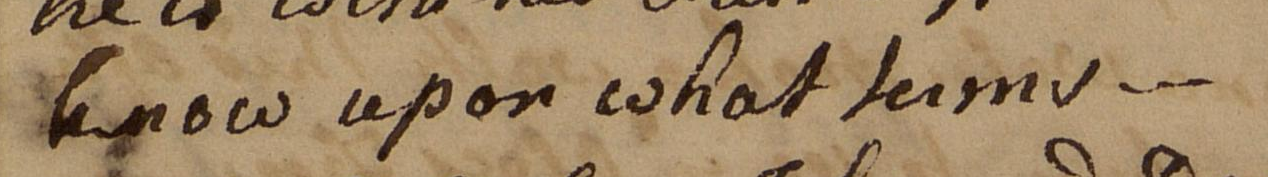know upon what terms--
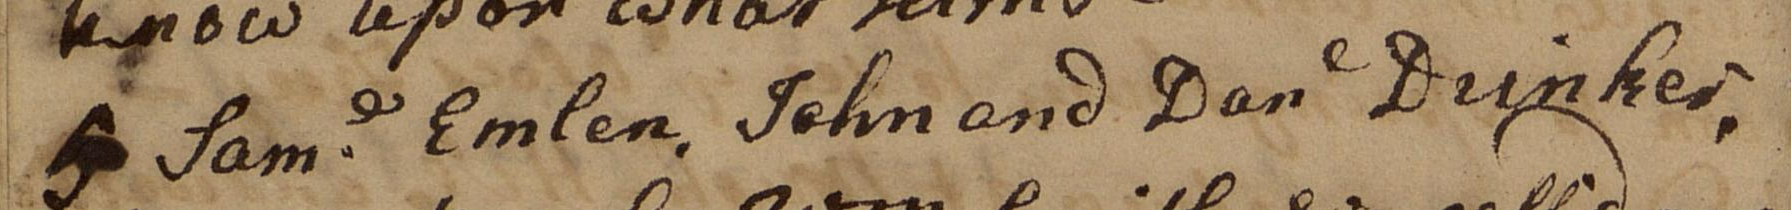5 Sam^l. Emlen, John and Dan^l Drinker,
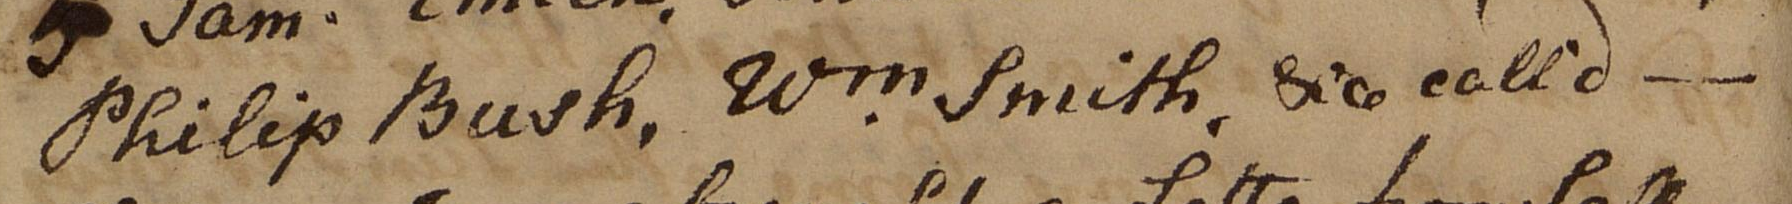Philep Bush, W^m. Smith &c call'd-
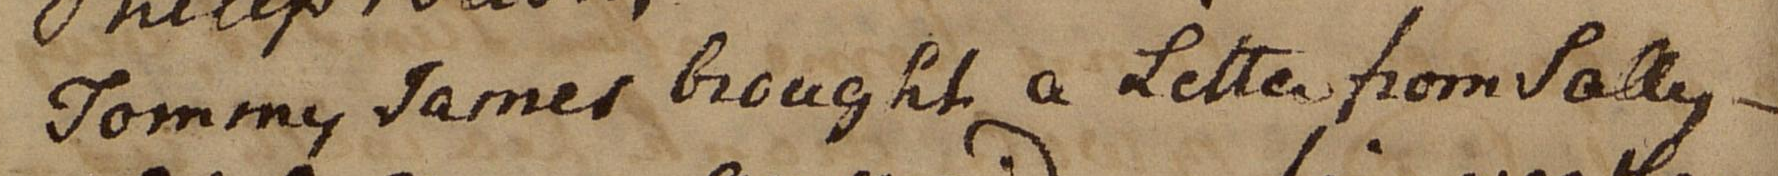Tommy James brought a Letter from Sally-
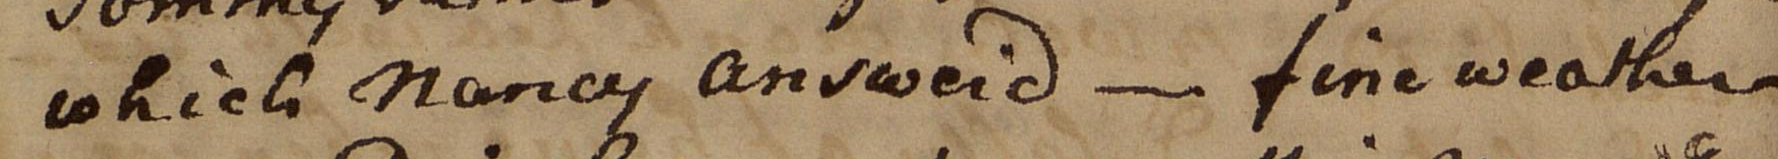which Nancy answer'd- fine weather
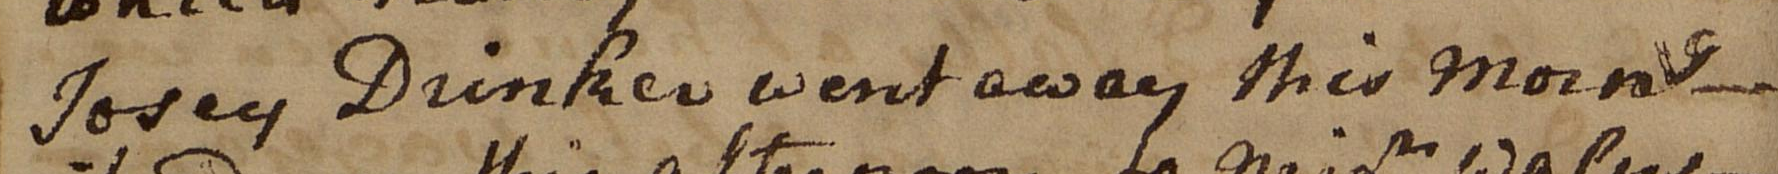Josey Drinker went away this morn^g-
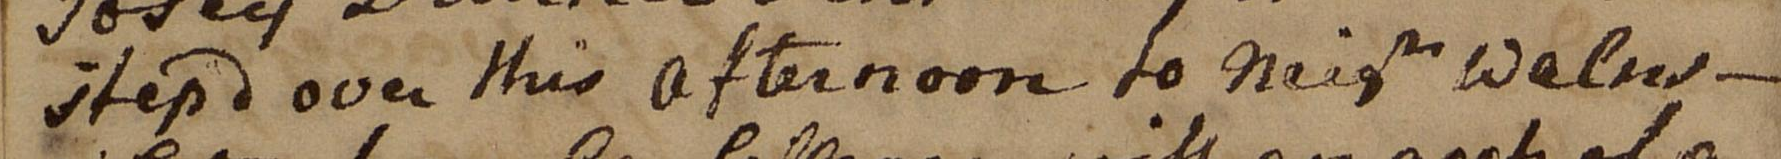step'd over this Afternoon to Neig^r Walns-
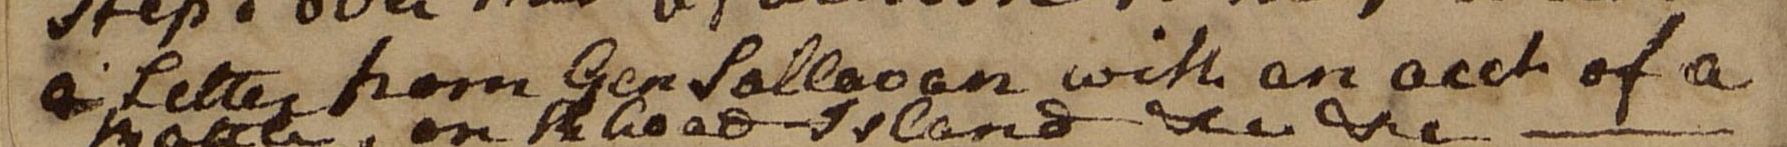a Letter from Gen Sallavan will an acct of a
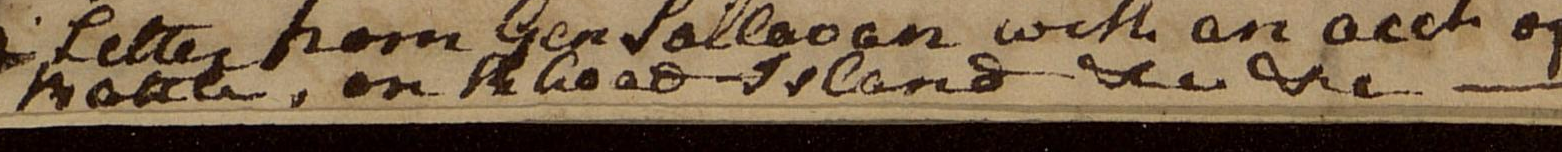Battle, on Rhoad Island &c &c-
